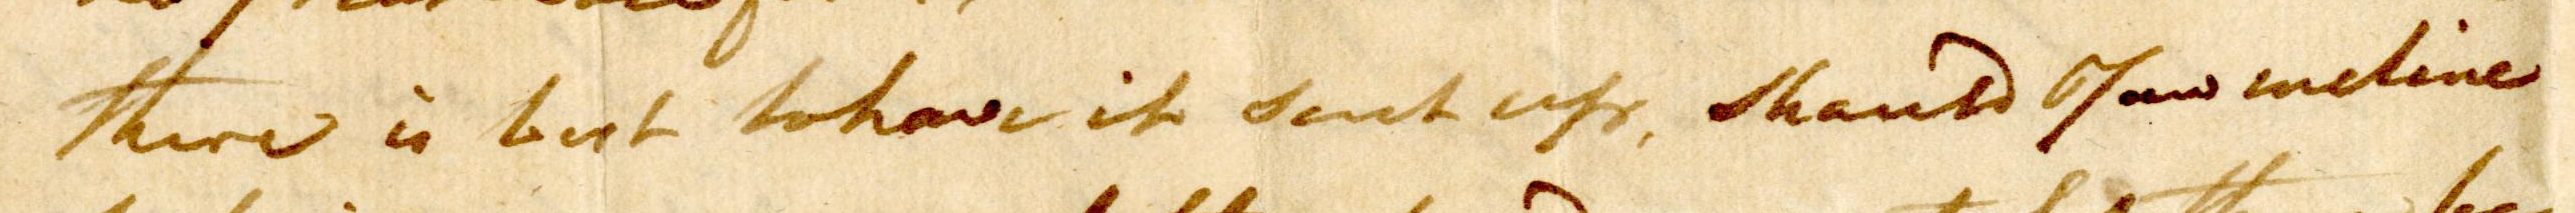there is but to have it sent up, should you incline
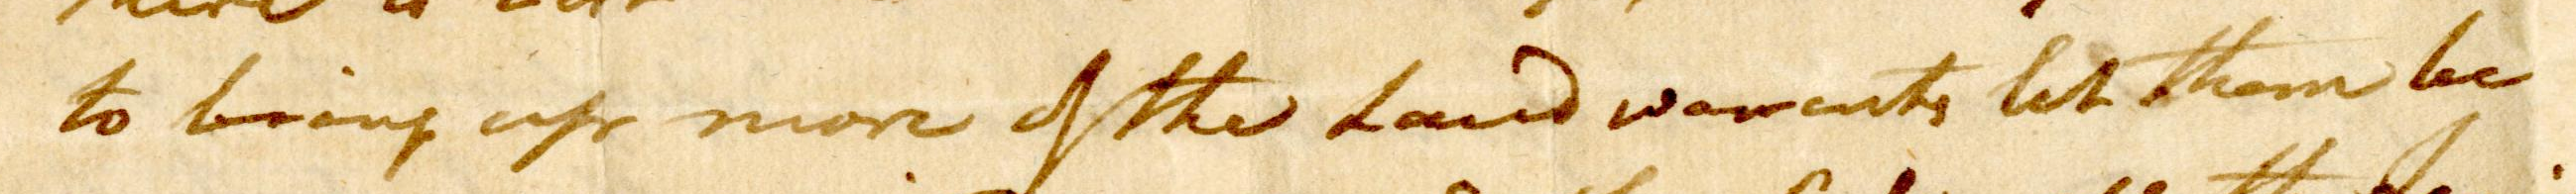to bring up more of the Land warrants let them be
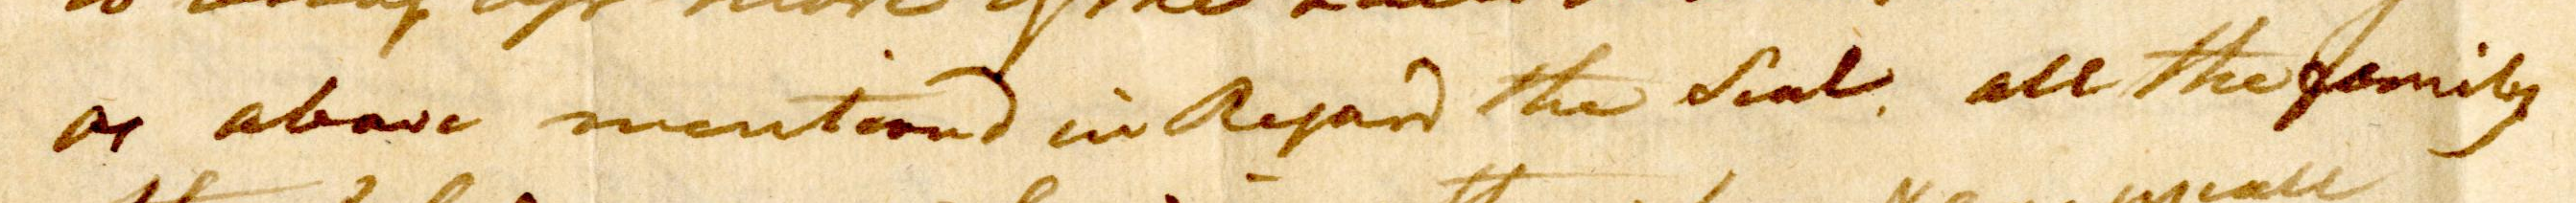as above mentiond in Regard the seal all the family
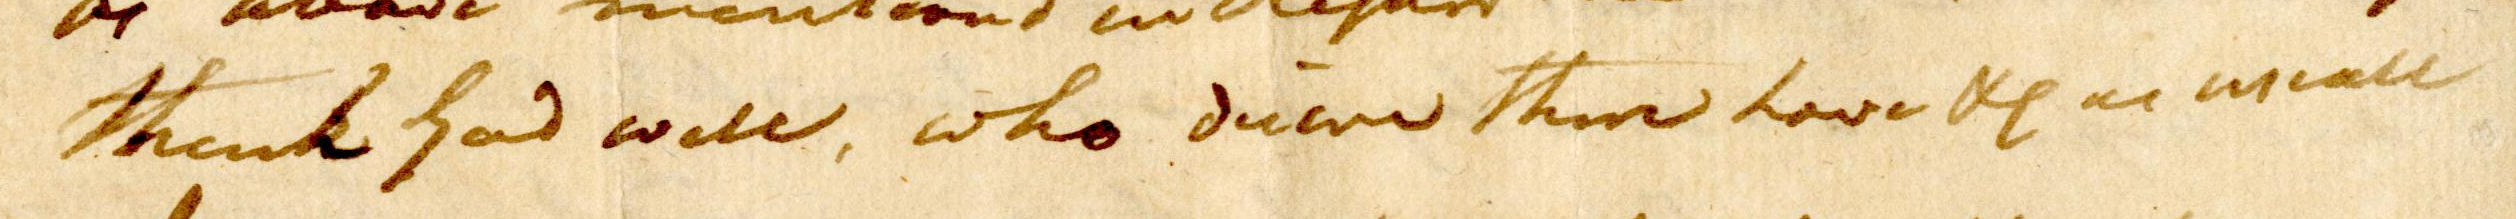thank God well, who desire there Love & as usuall
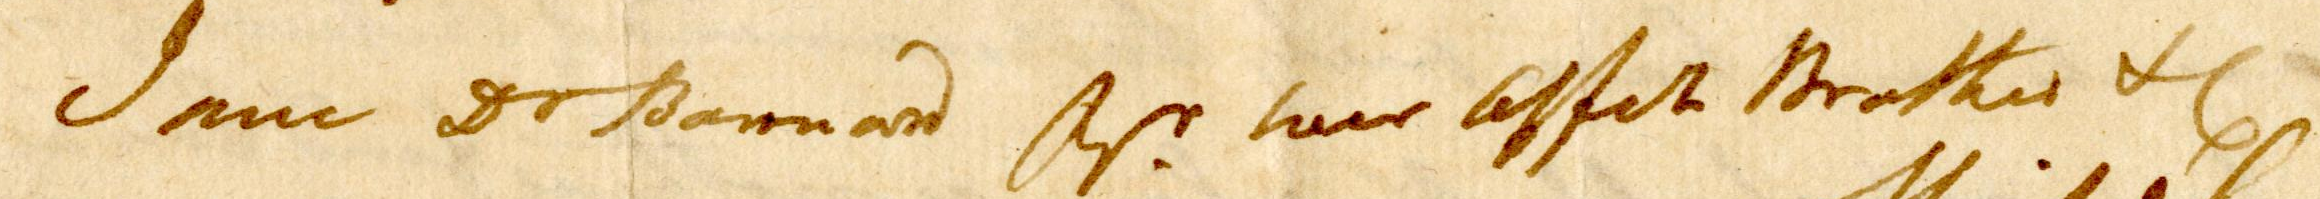I am D^r Barnard y^r. ever affet Brother &C
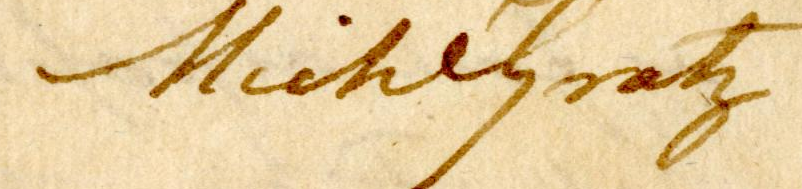Mich^l Gratz
